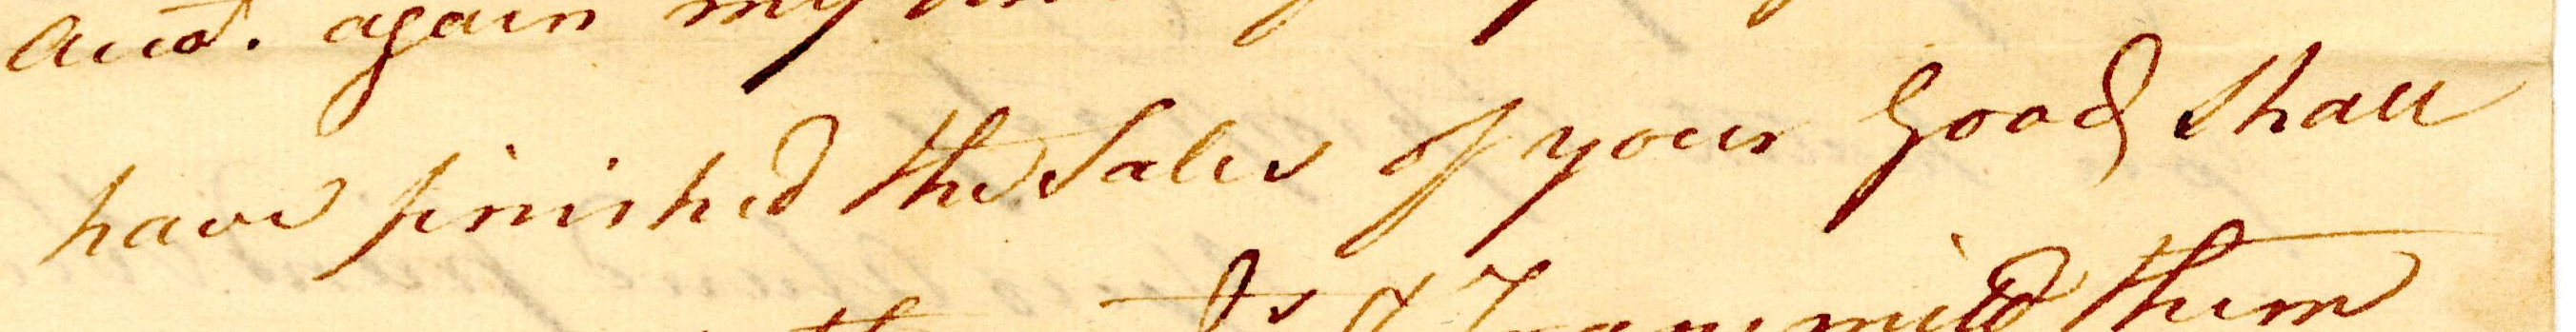have finished the Sale of your Good shall
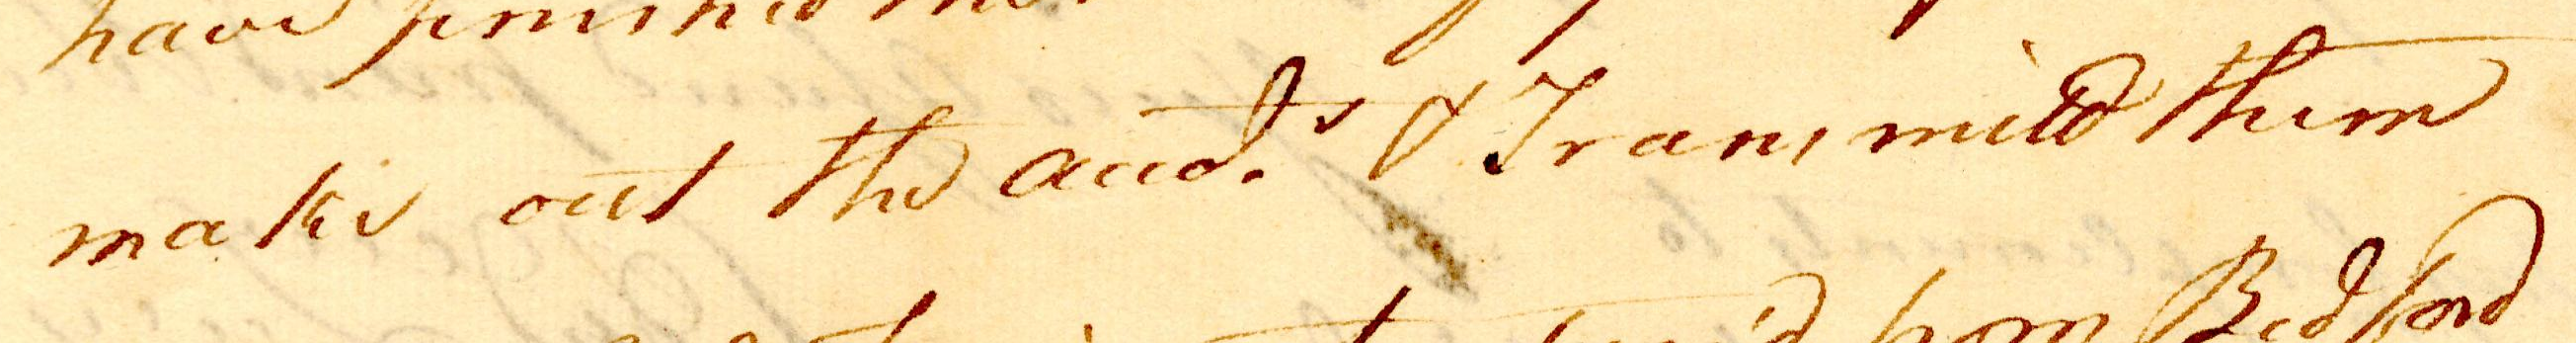make out the acco^ts. & Transmitd them
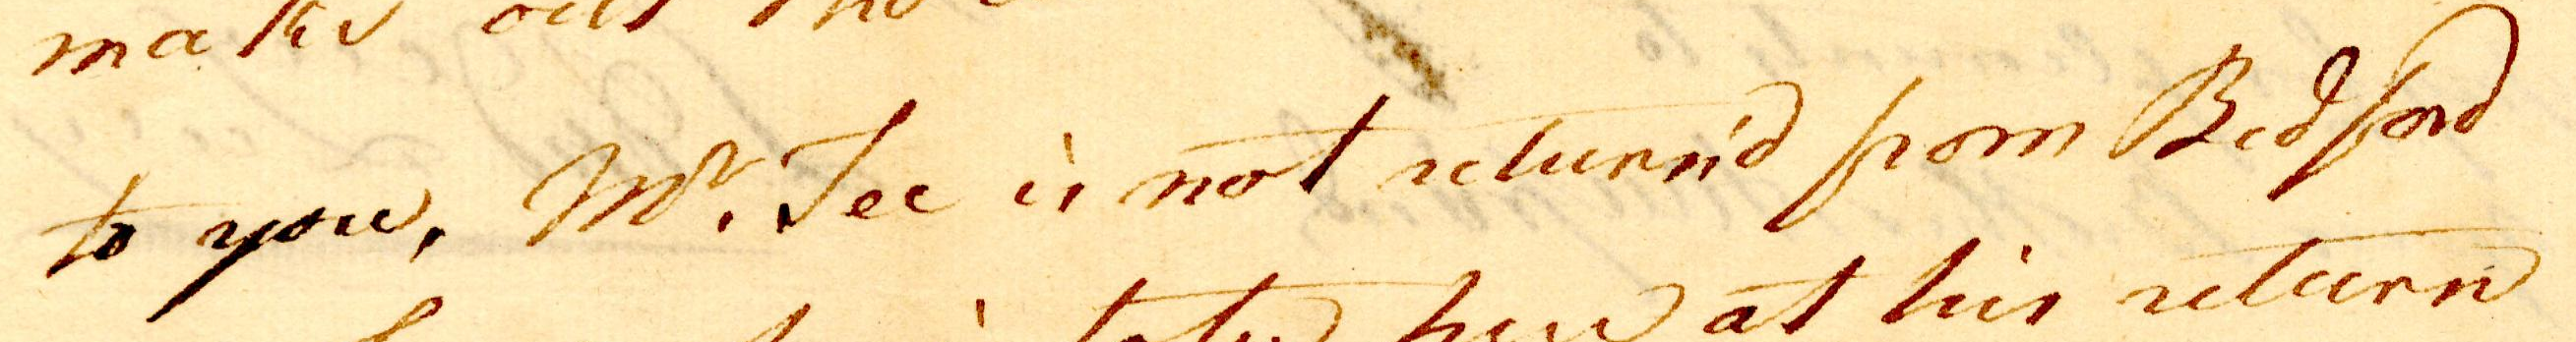to you, M^r. Tee is not return'd from Bedford
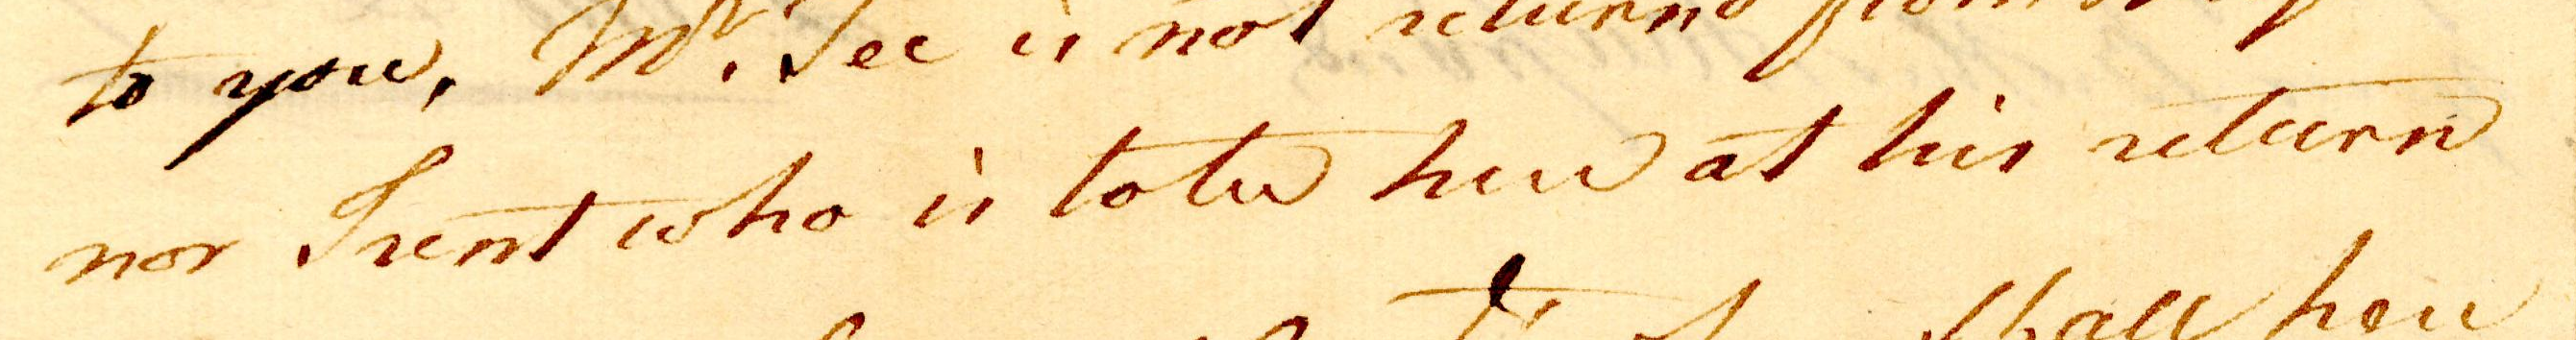nor Trent who is later here at his return
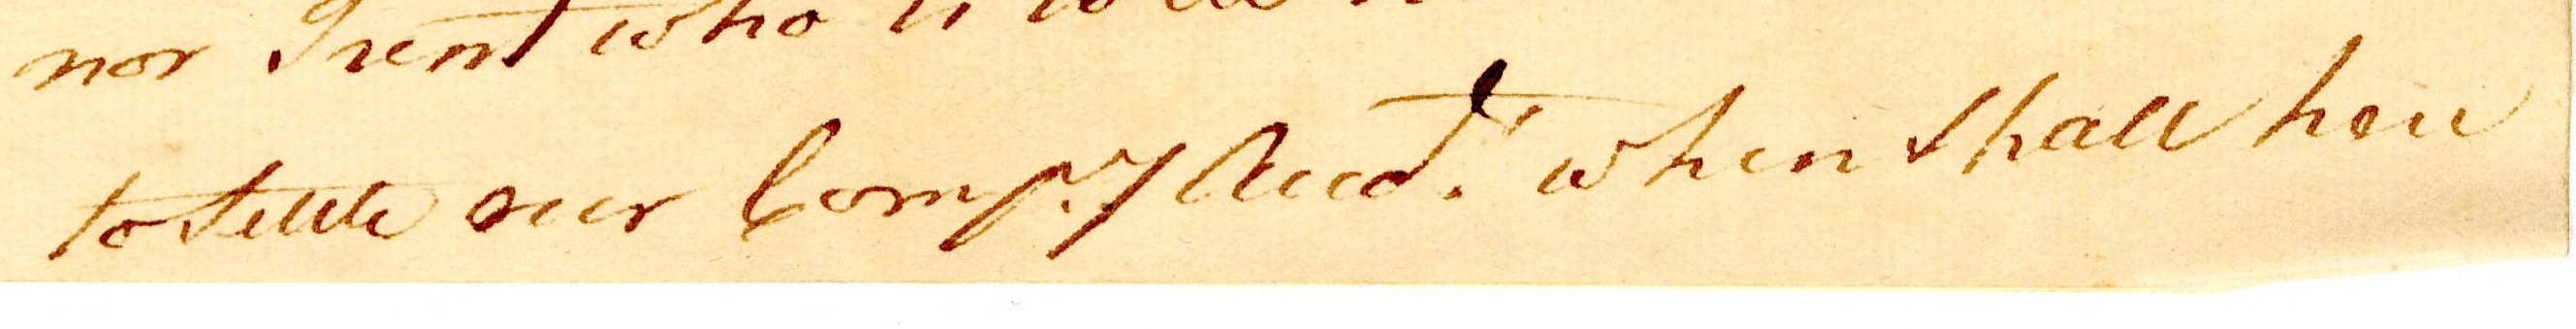to Settle our Comp^y. Accd^t. when shall here
